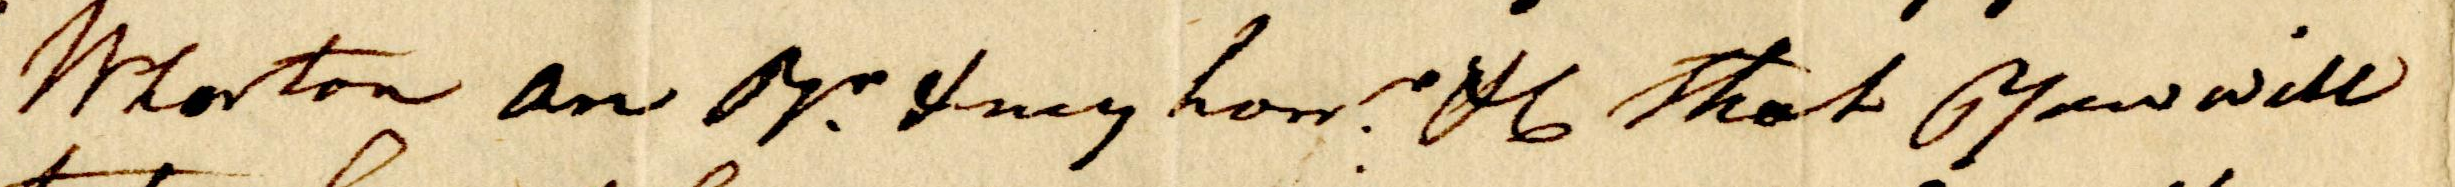Wharton an y^r. Lucy hon^e & that you will
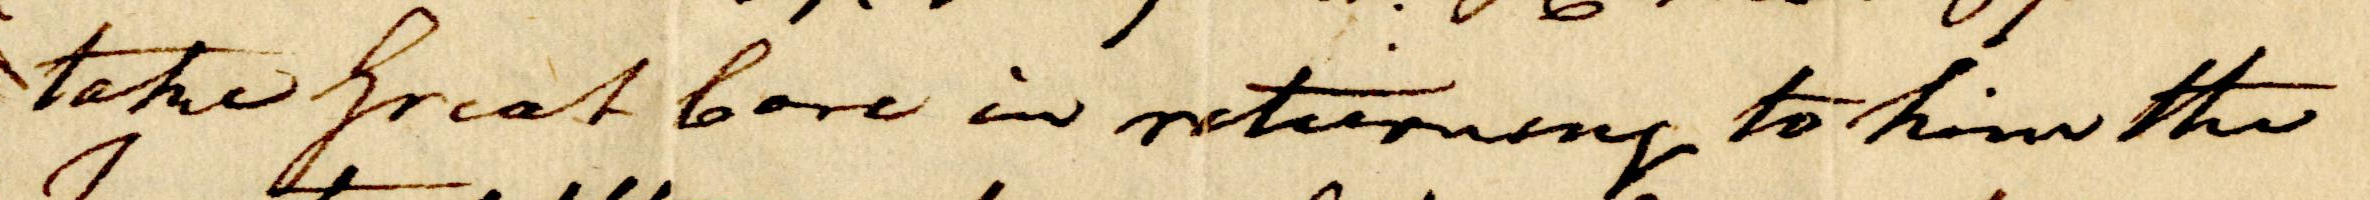take Great Care in returning to him the
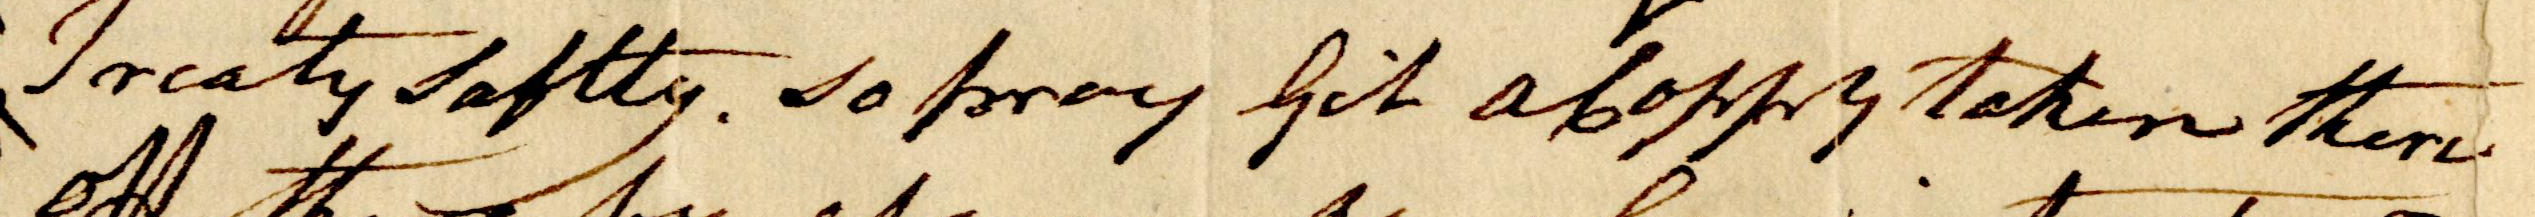Treaty Saftly. So pray Get a Coppy taken there
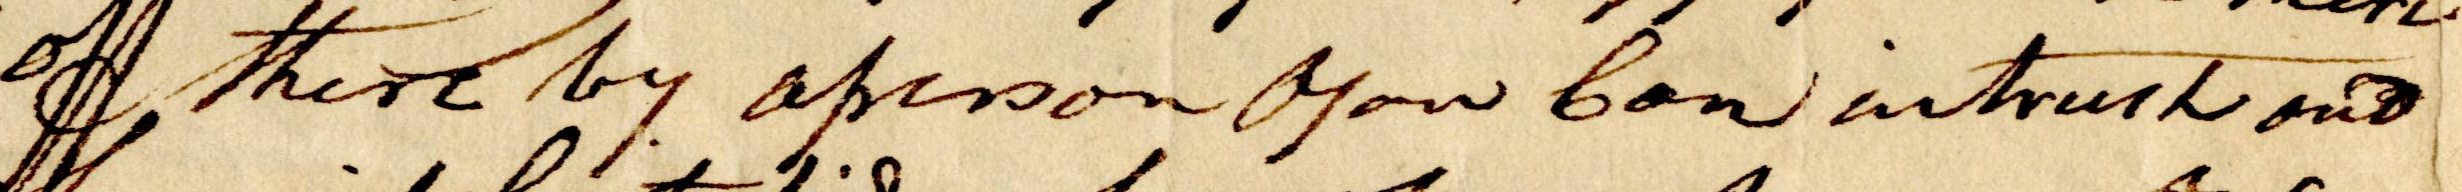off there by a person you can intrust and
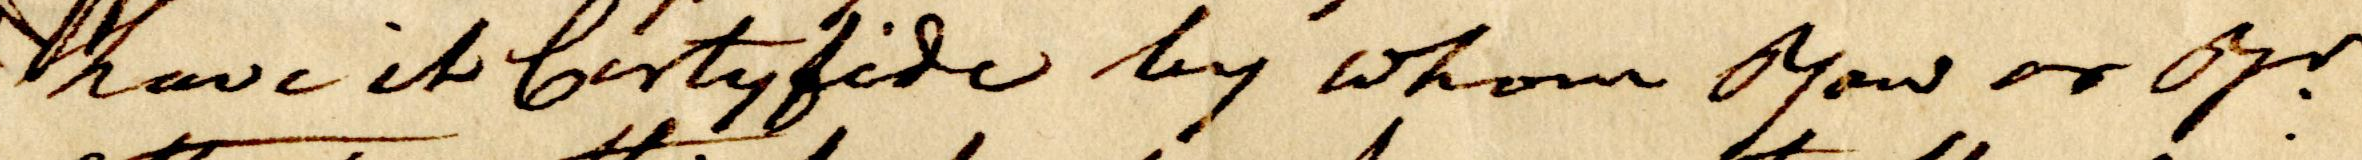have it Certyfide by whom you or y^r.
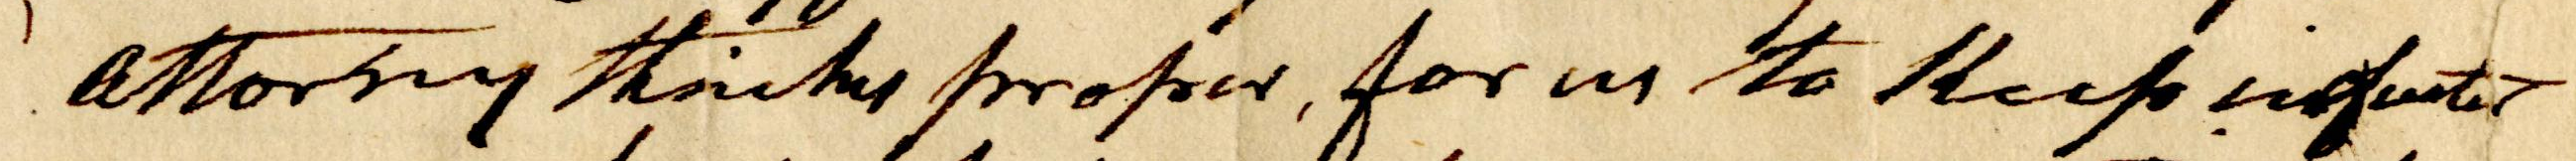attorney thinks proper, for us to keep regard
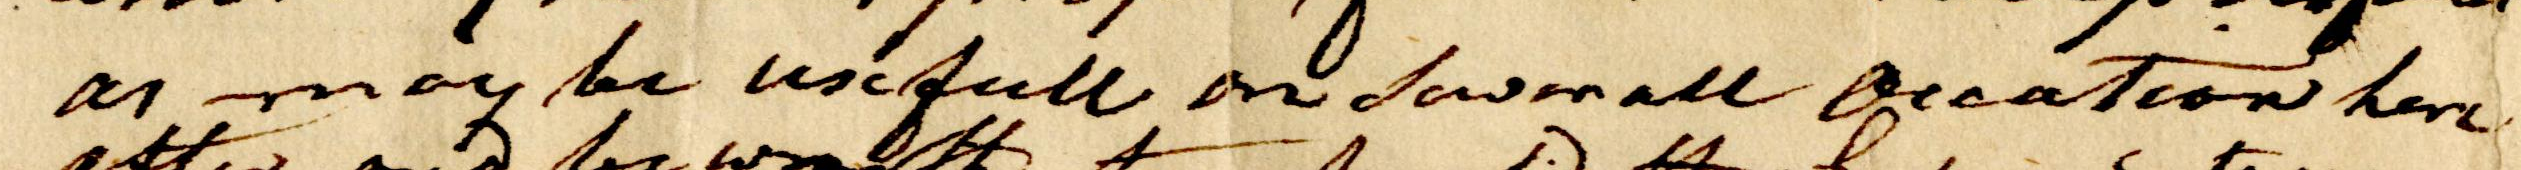as may be usefull on severall occation here
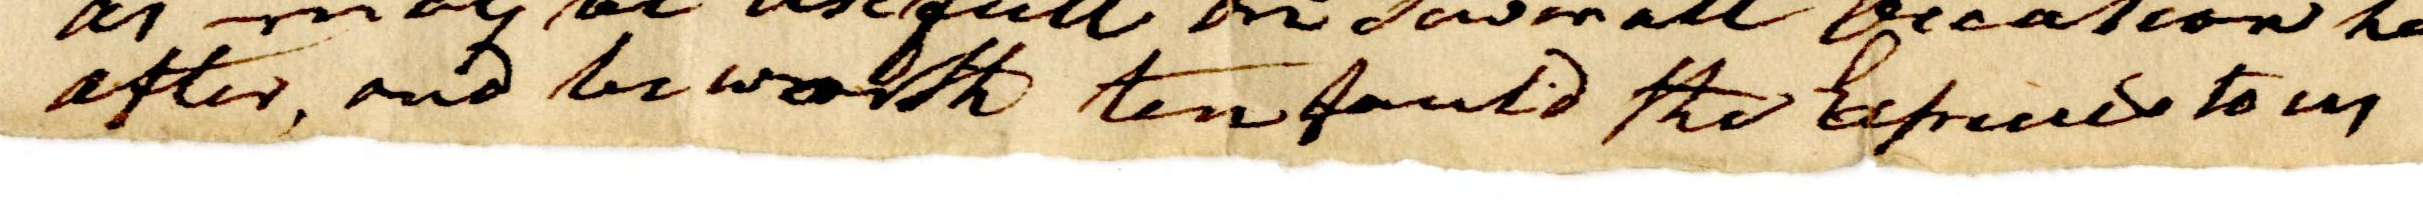after and be worth ten fauld the Expence to us
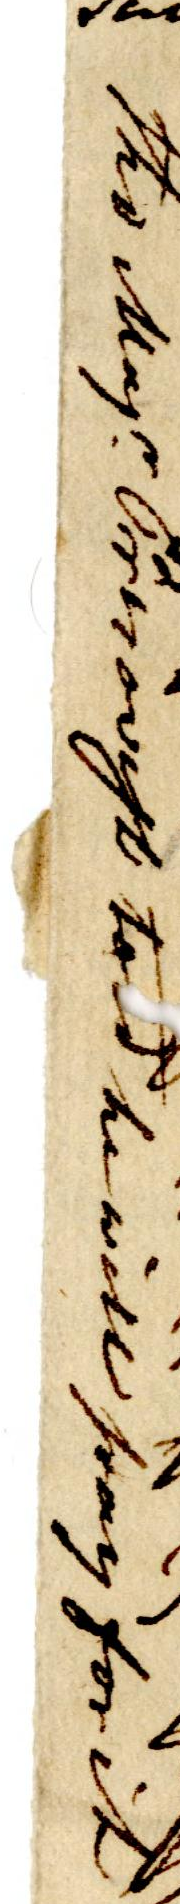the Maj^r. Provost told he will pay for it
